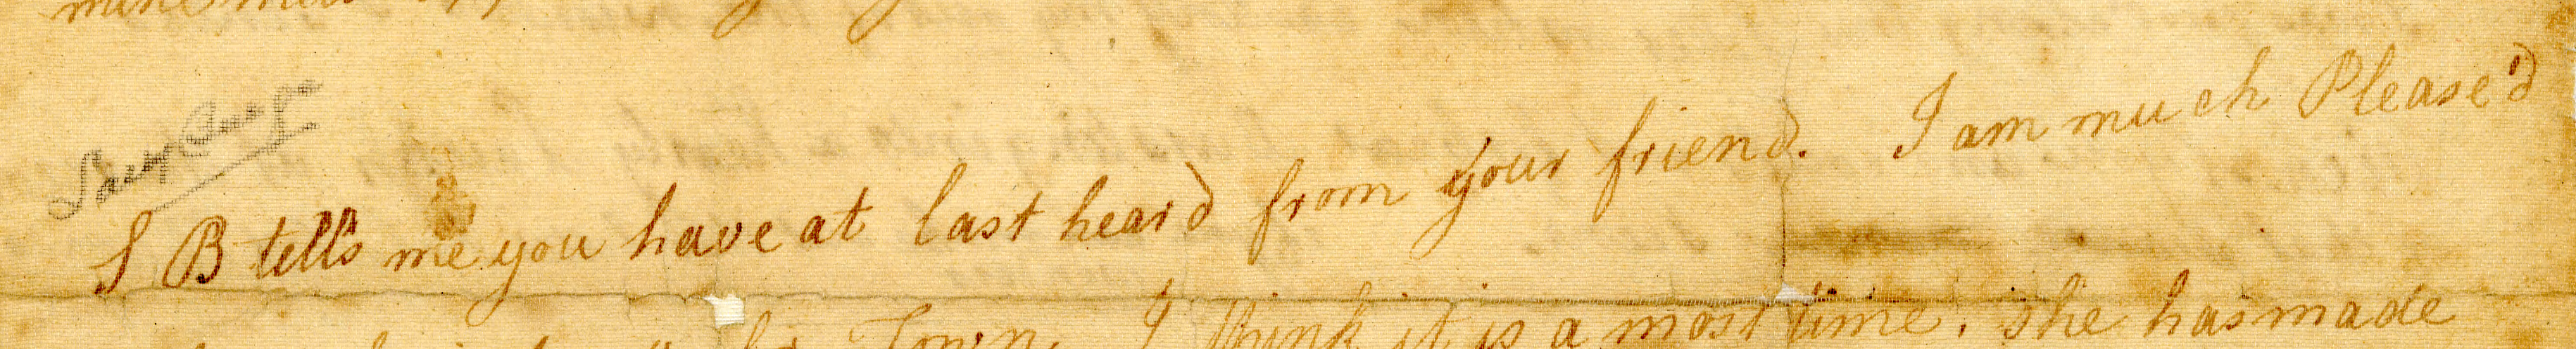SB tells me you have at last heard from your friend. I am much Please'd
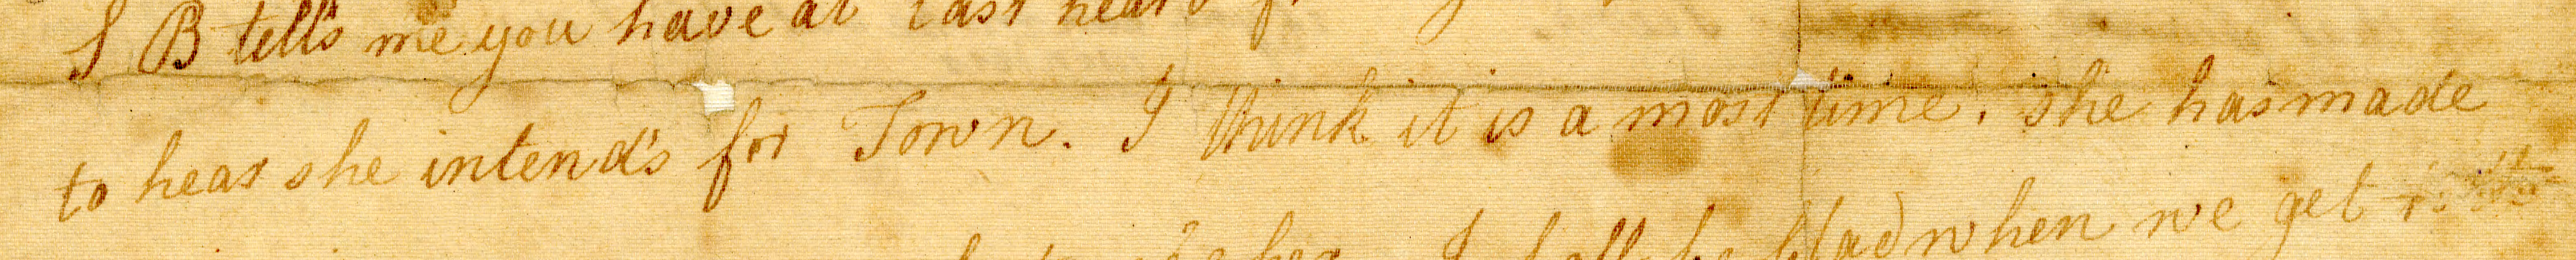to hear she intends for Town. I think it is a most time, she has made
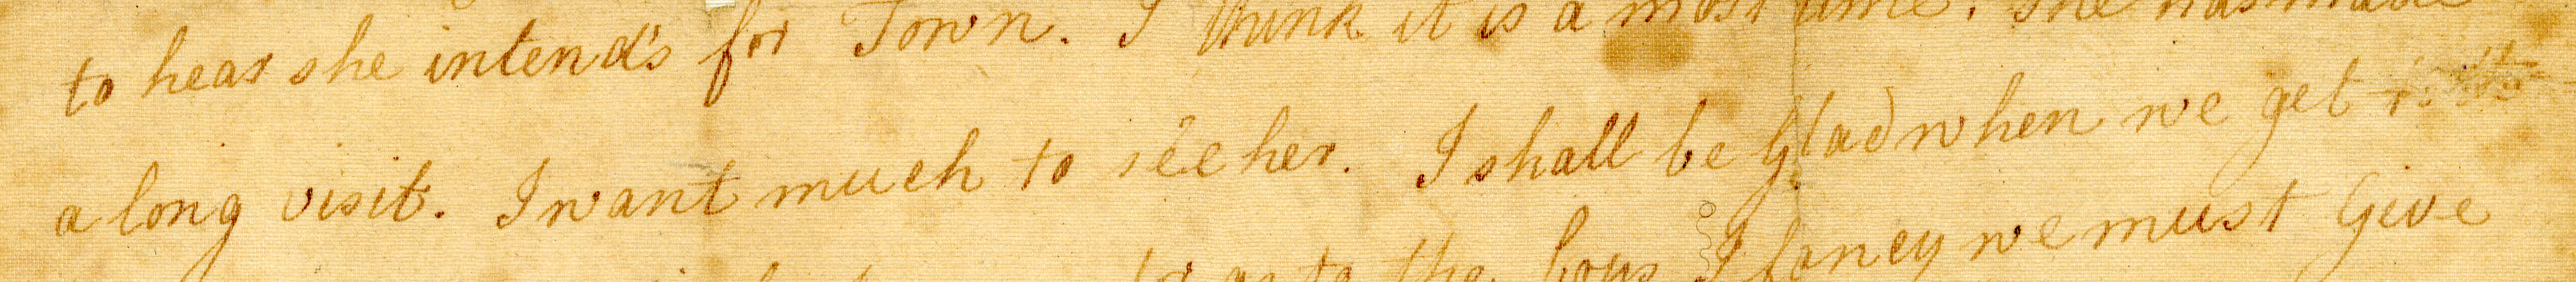a long visit. I want much to see her. I shall be Glad when we get to
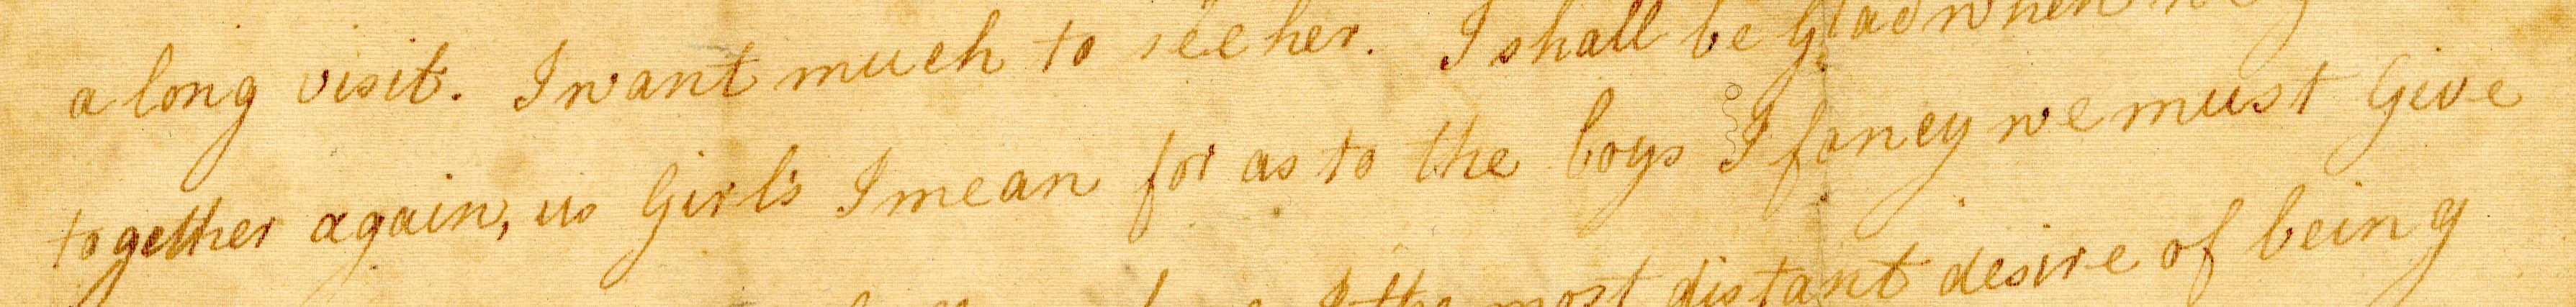together again, us Girl's I mean for as to the boys I fancy we must Give
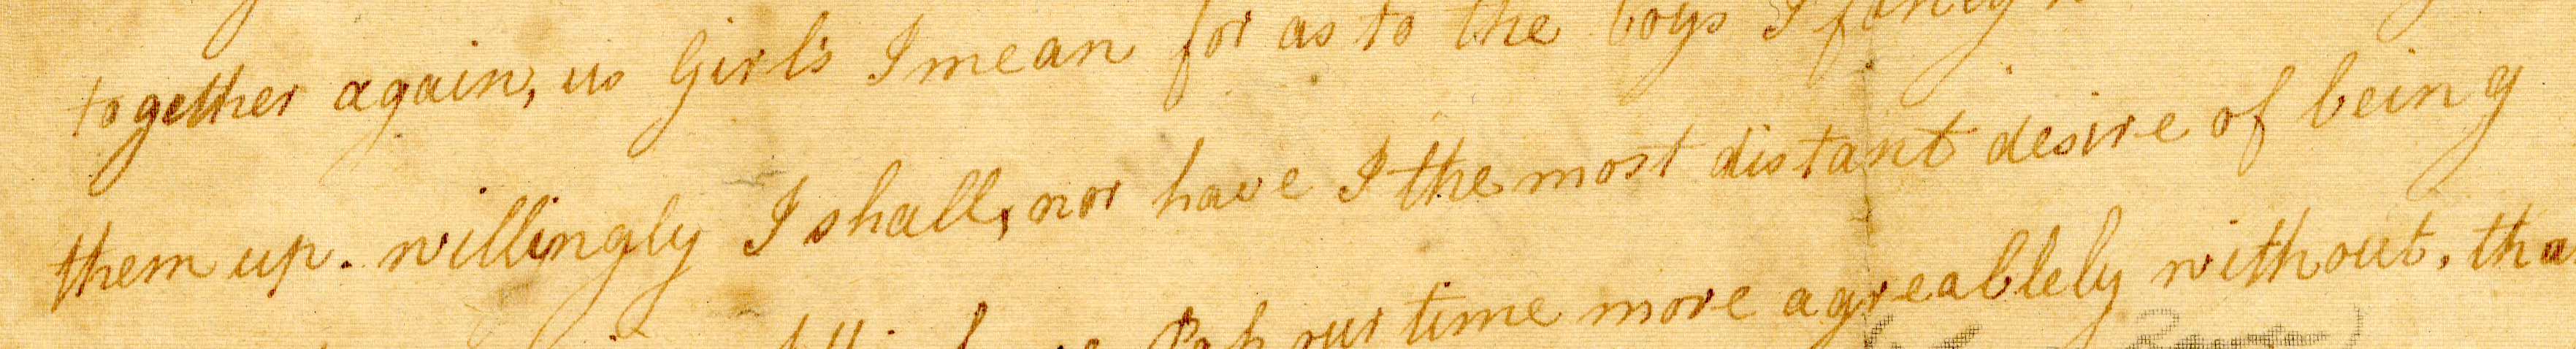them up willingly I shall, nor have I the most distant desire of being
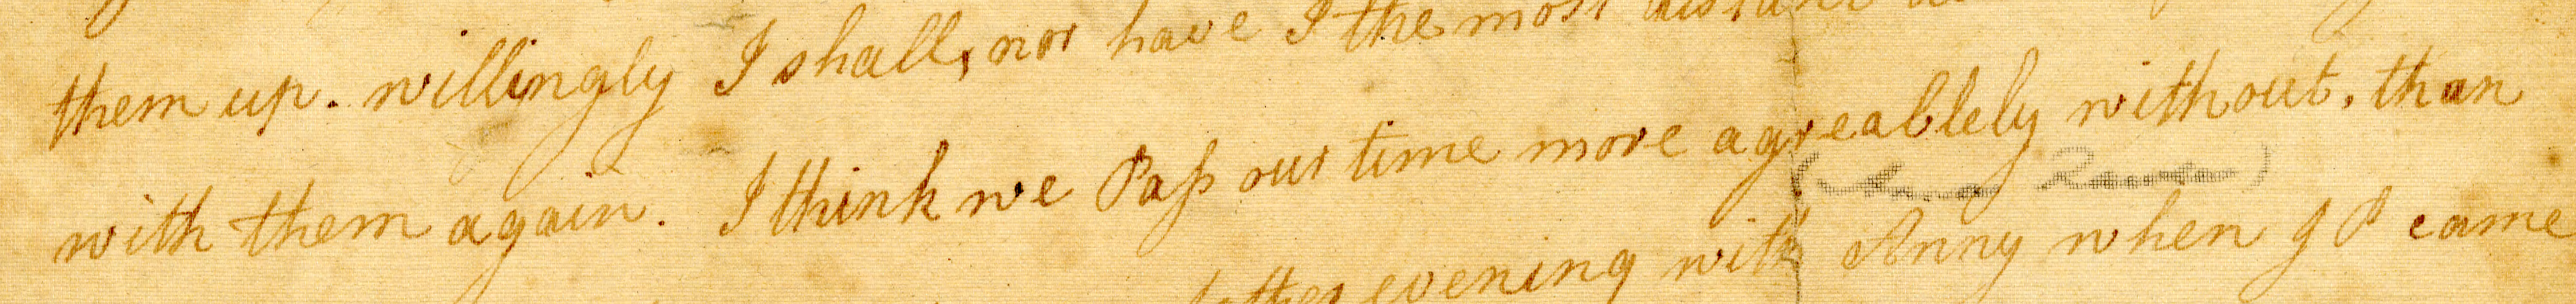with them again. I think we Pass our time more agreablely without, than
